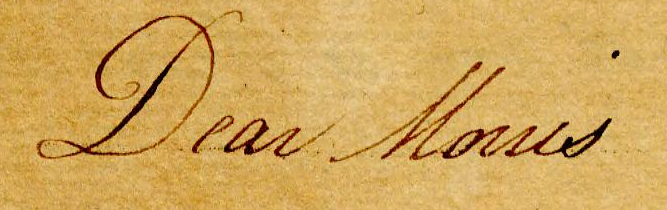Dear Morris
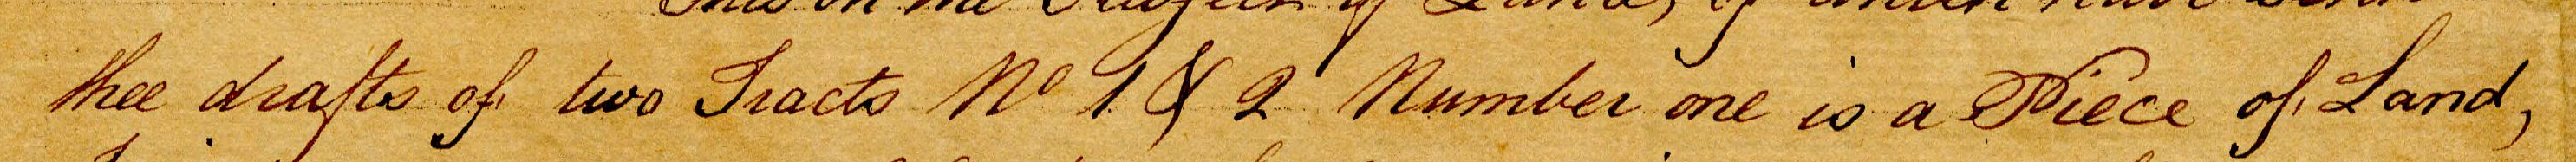thee drafts of two Tracts N^o 1 & 2 Number one is a Piece of Land,
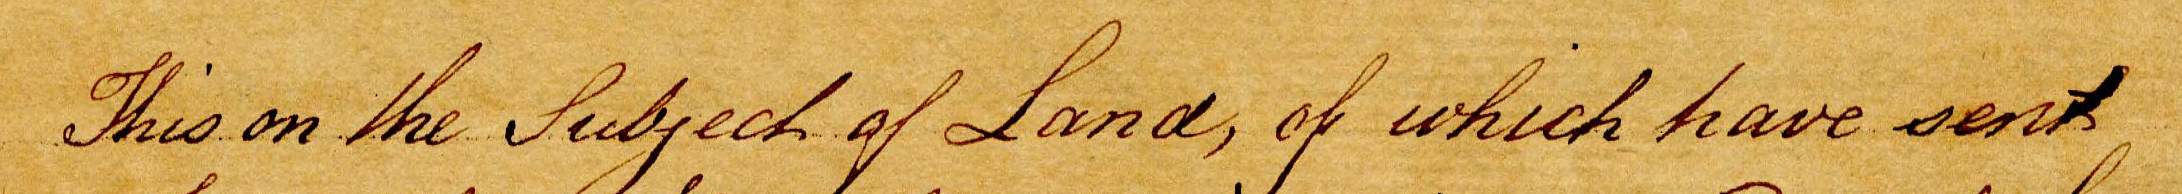This on the Subject of Land, of which have sent
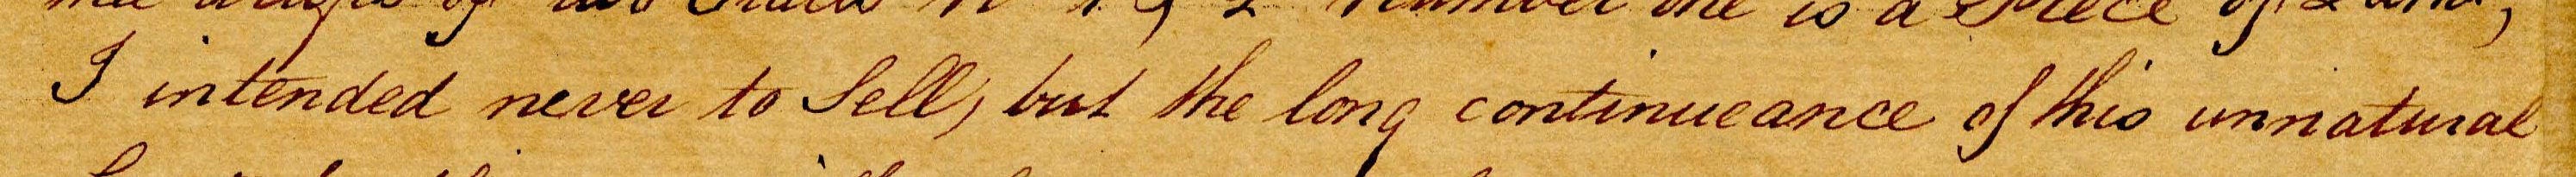I intended never to sell, but the long contiueance of this unnatural
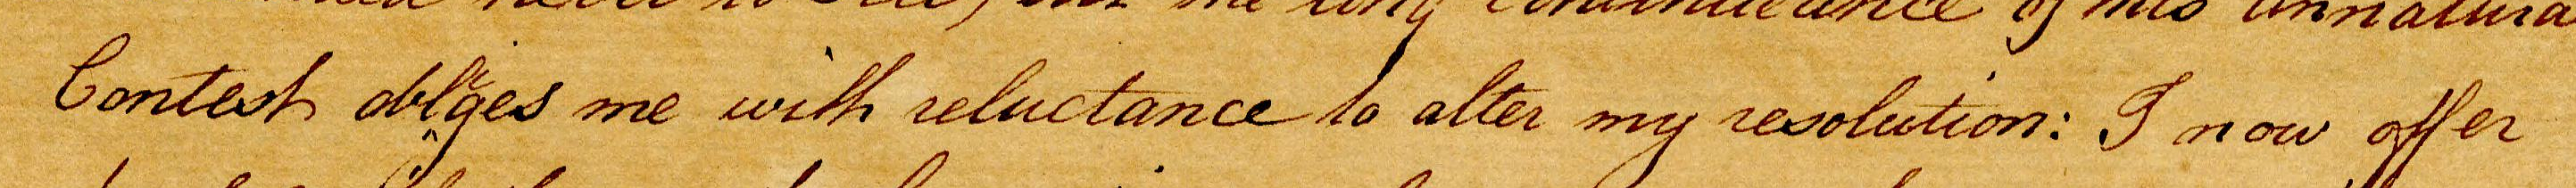Contest obl^iges me with reluctance to alter my resolution: I now offer
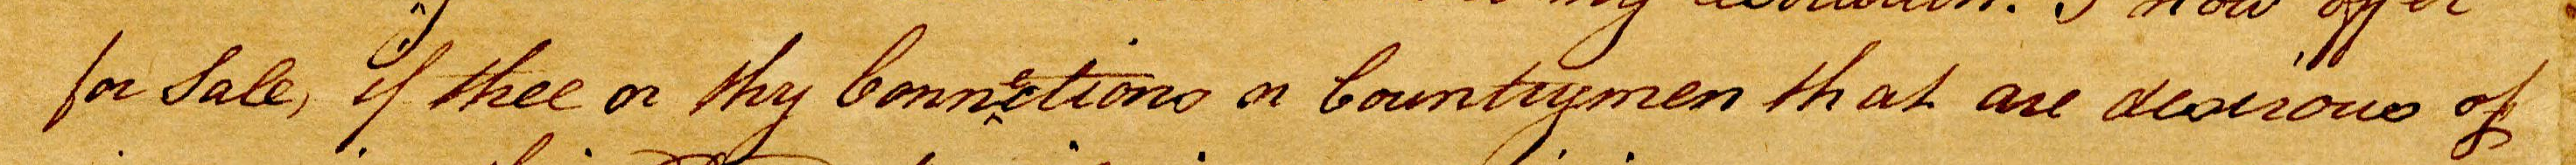for Sale, if thee or thy Conn^ections or Countrymen that are desirous of
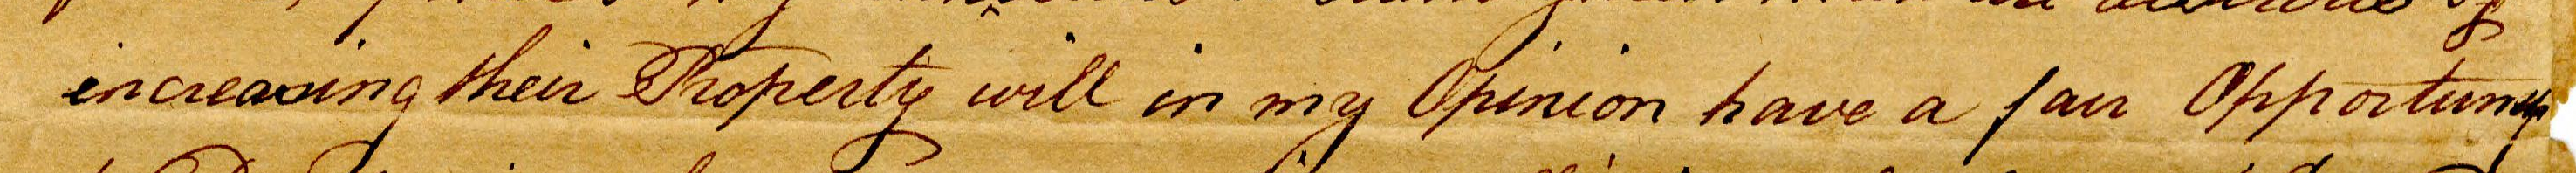increasing their Property will in my Opinion have a fair Opportuny
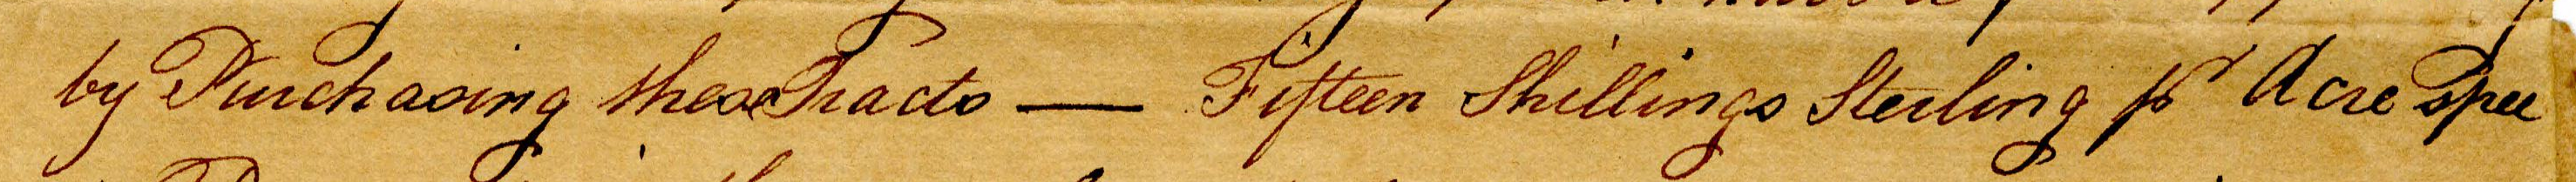by Purchasing these Tracts- Fifteen Shillings Sterling p^r Acre spee
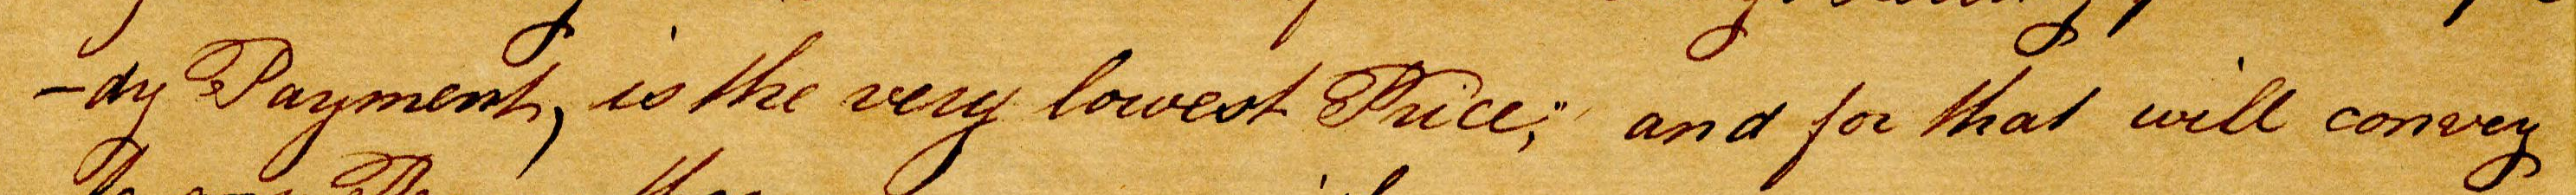-dy Payment, is the very lowest Price; and for that will convey
